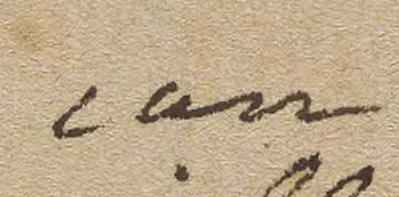can
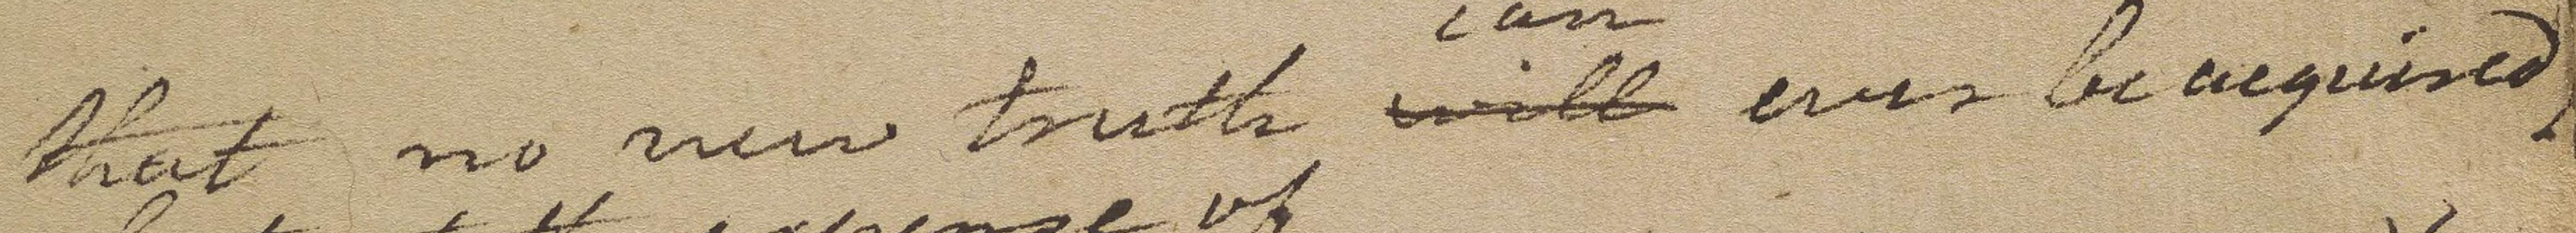that no new truth [will] ever be acquired
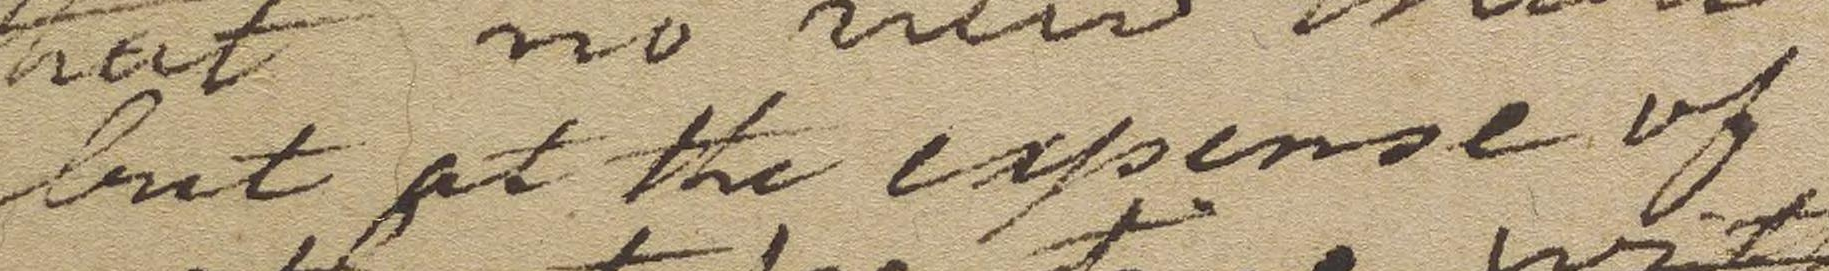but at the expense of
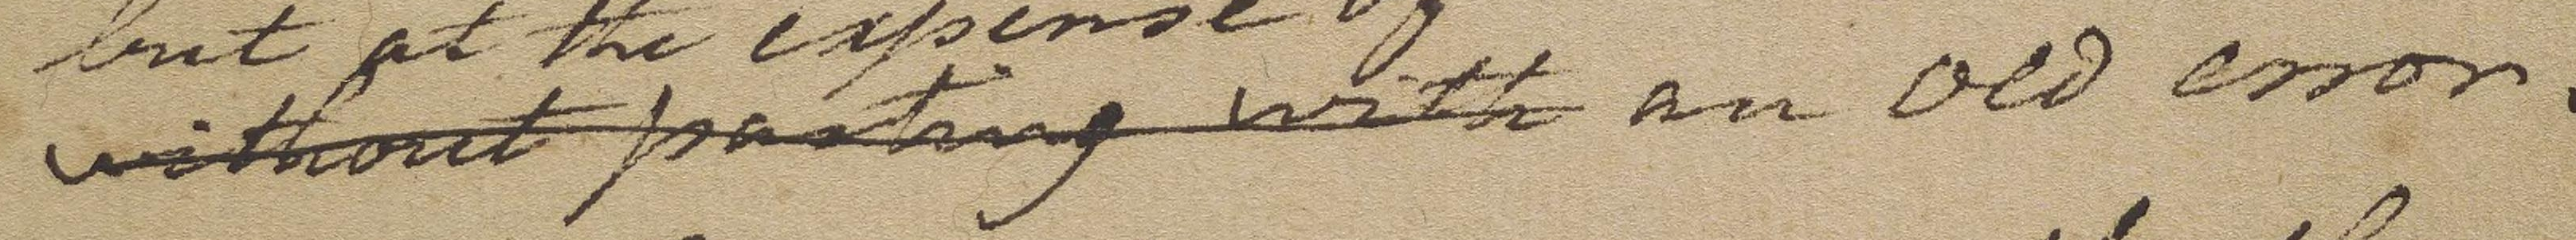[without parting with] an old error.
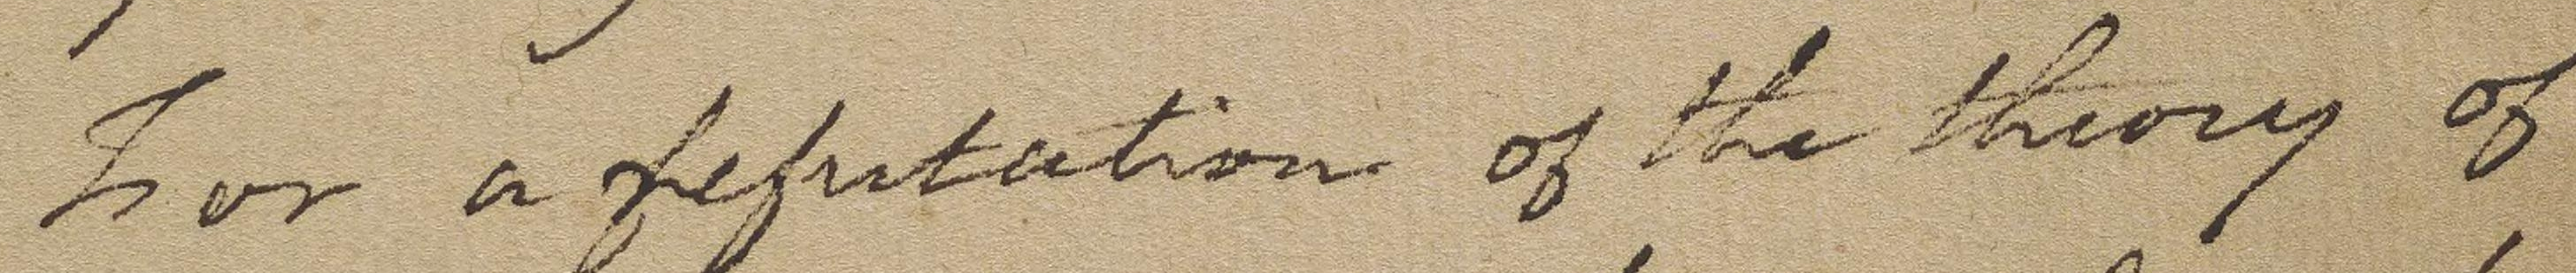For a refutation of the theory of
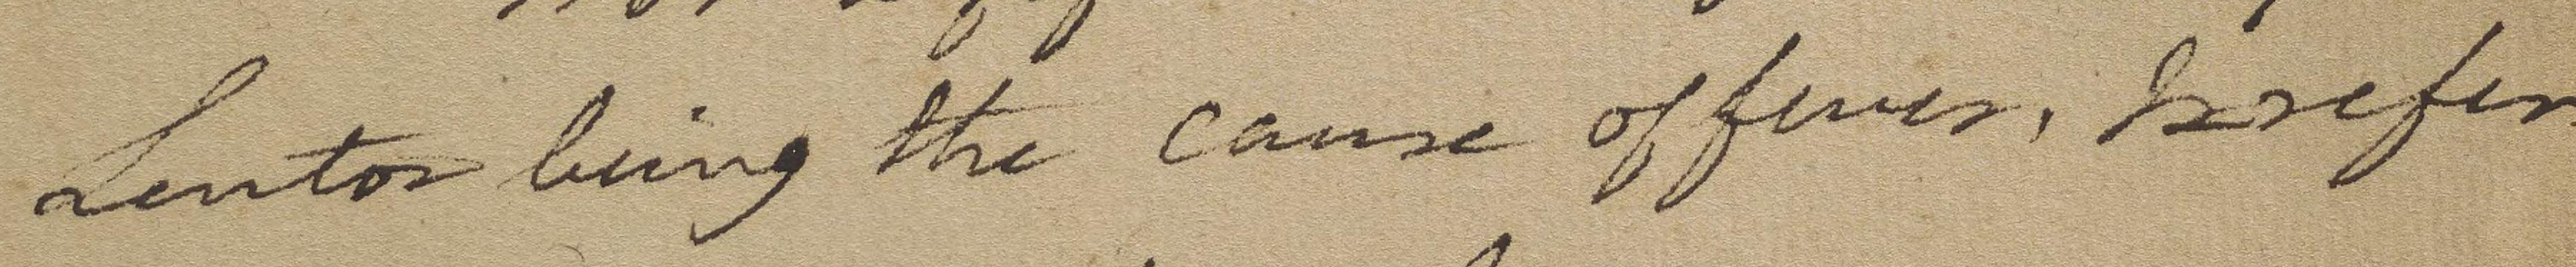Lentos being the cause of fever, & refer
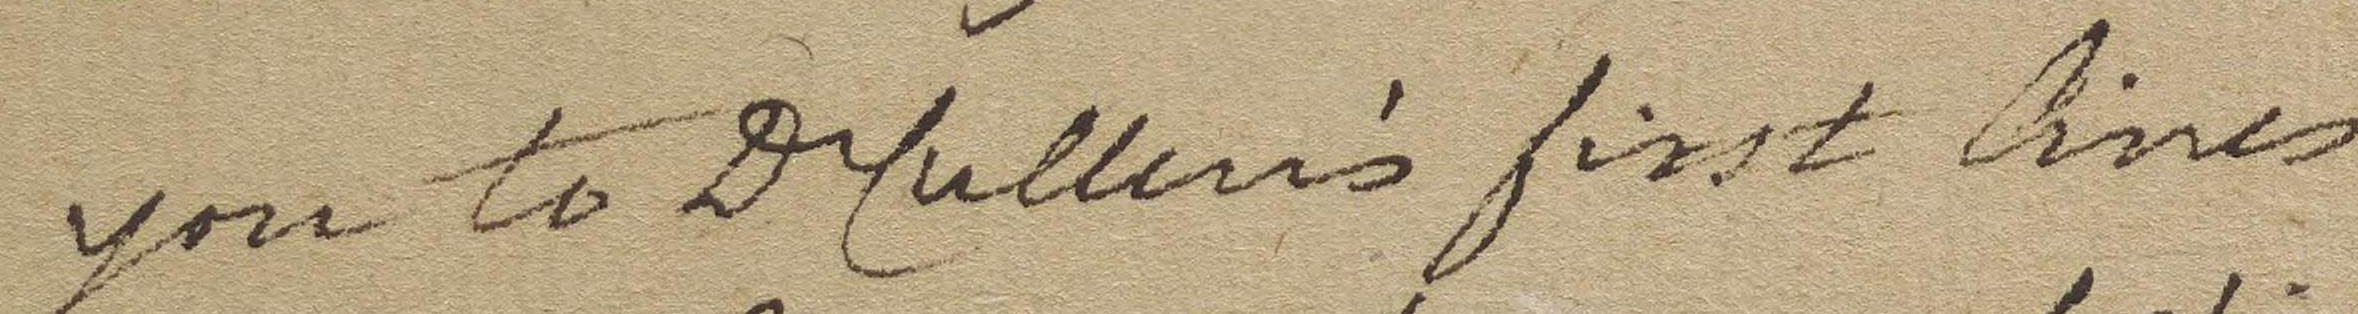you to D^r Cullen's first lines.
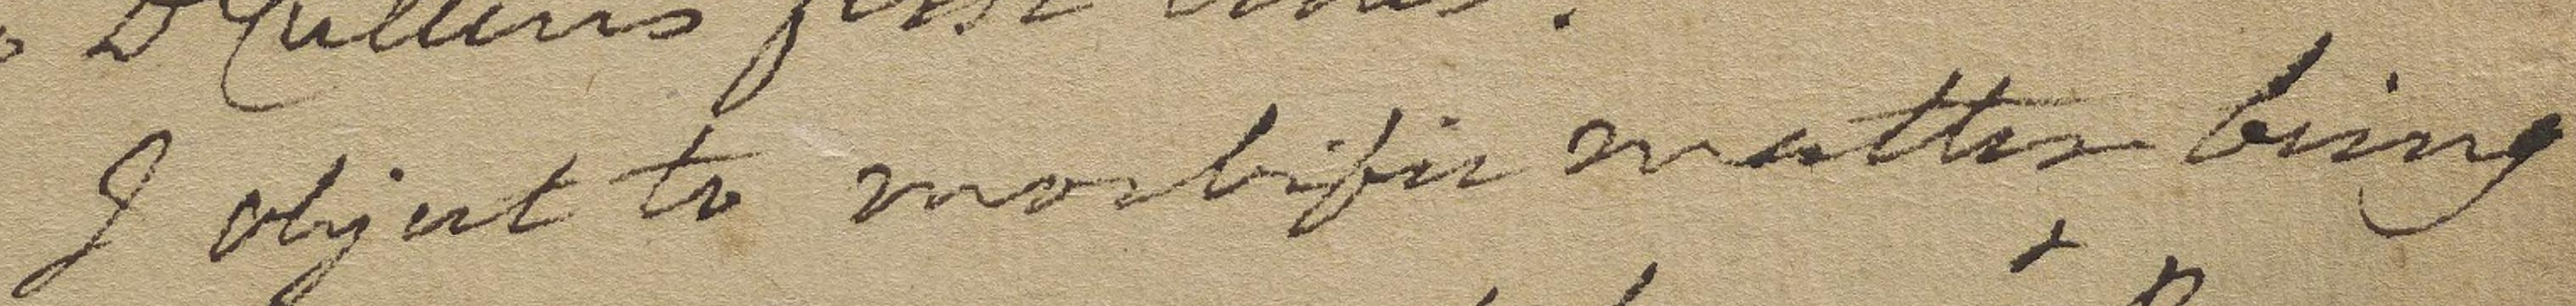I object to morbific matter being
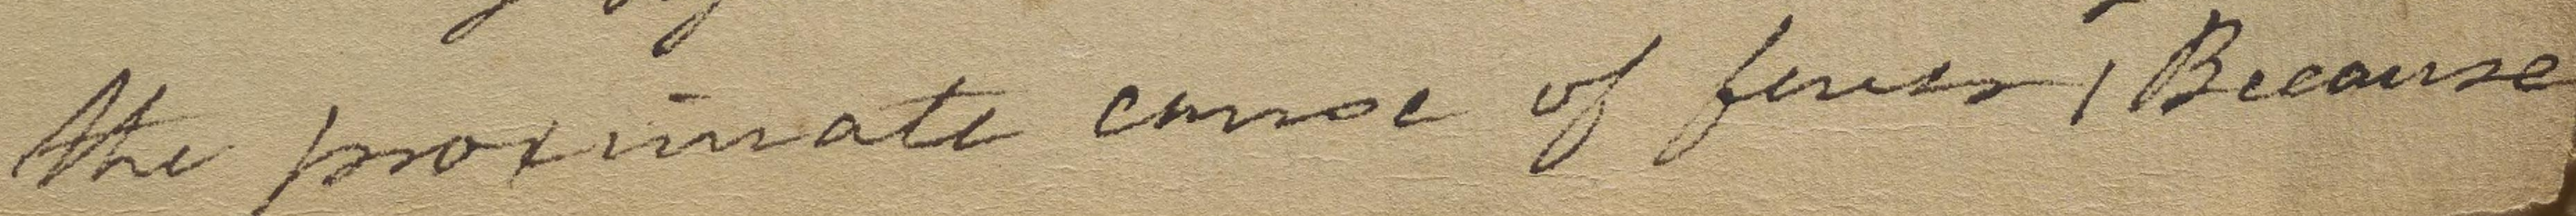the proximate cause of fever, Because
